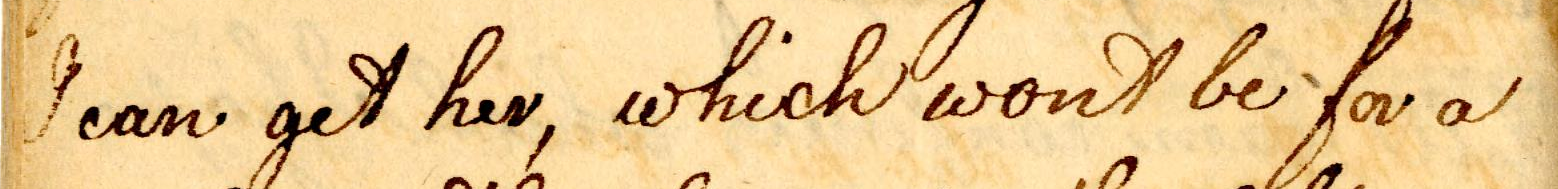I can get her, which wont be for a
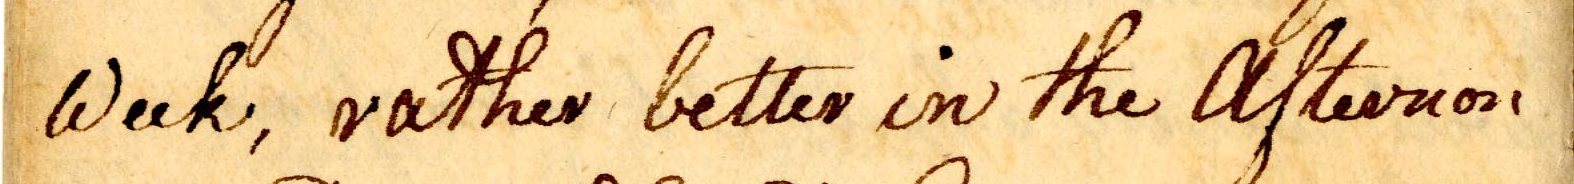Week, rather better in the Afternon
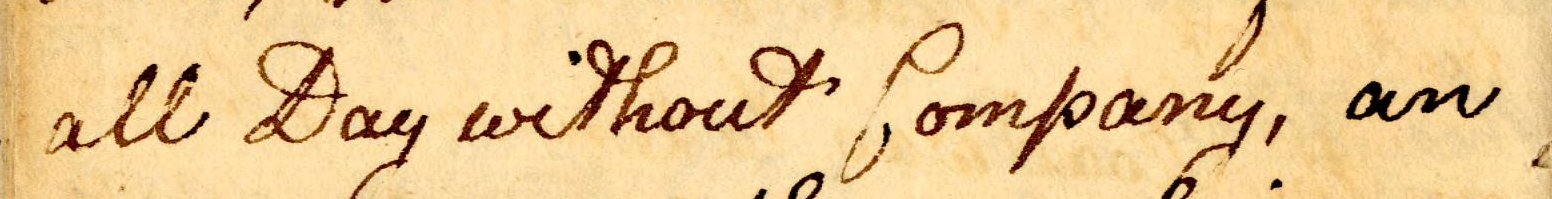all Day without Company, an
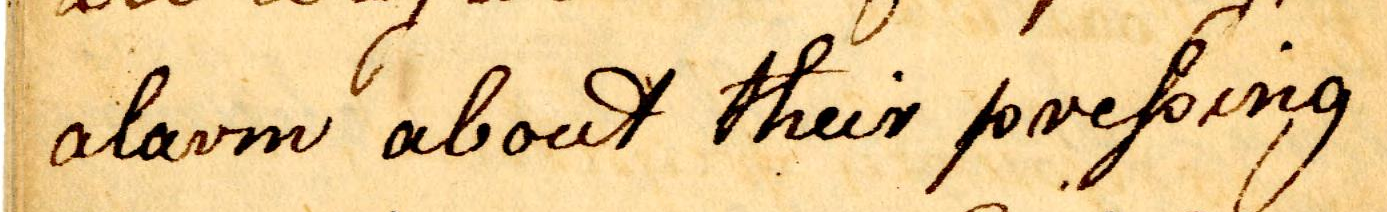alarm about their pressing
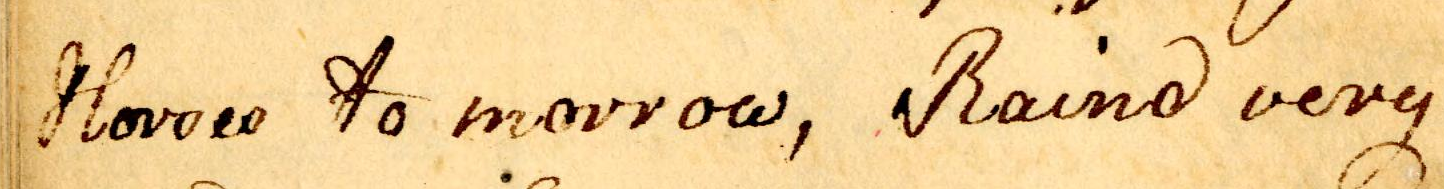Horses to morrow, Raind very
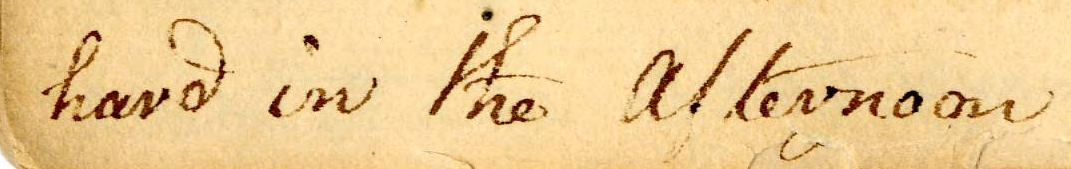hard in the Afternoon
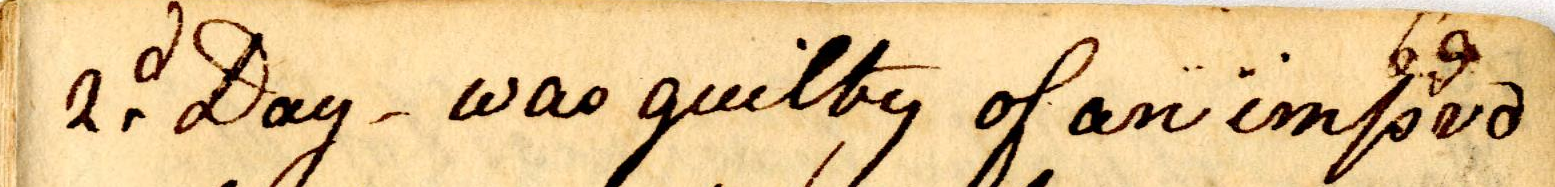2^d. Day- was guilty of an impro
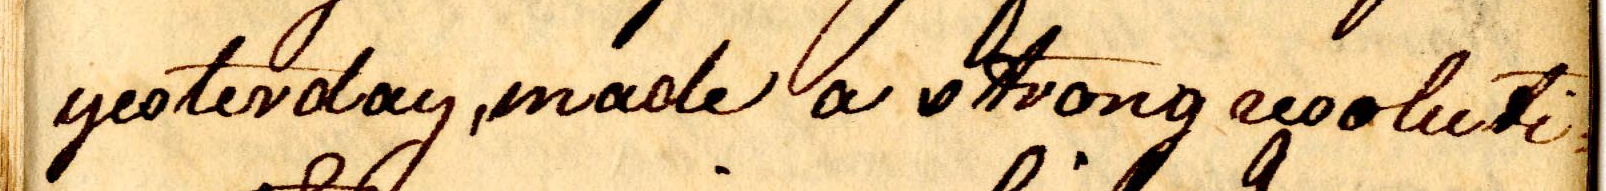yesterday, made a strong resoluti-
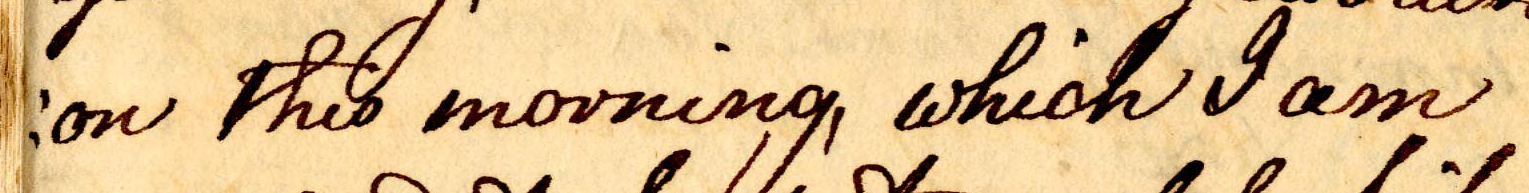-on this morning, which I am
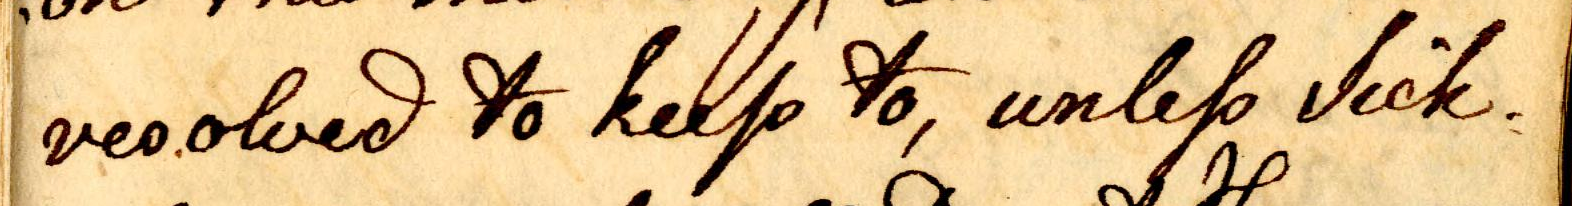resolved to keep to, unless Sick-
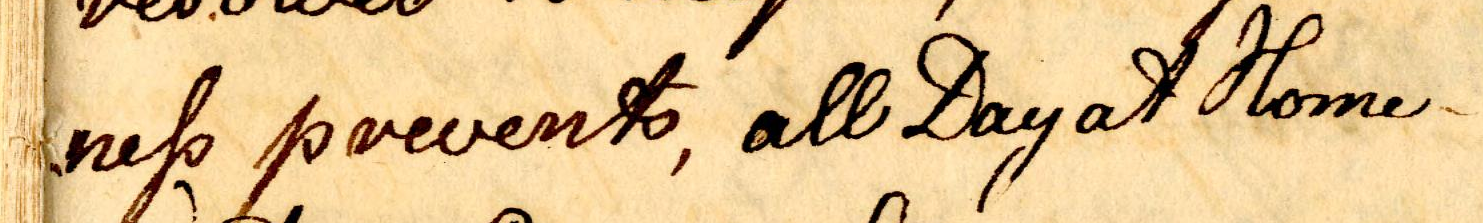ness prevents, all Day at Home
